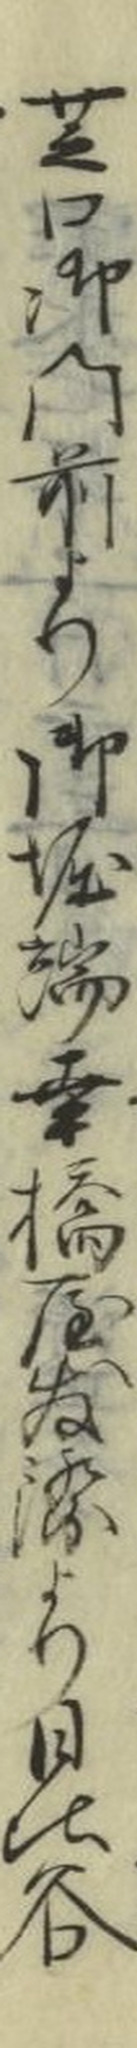芝口御門前より御堀端幸橋屋敷際より日比谷
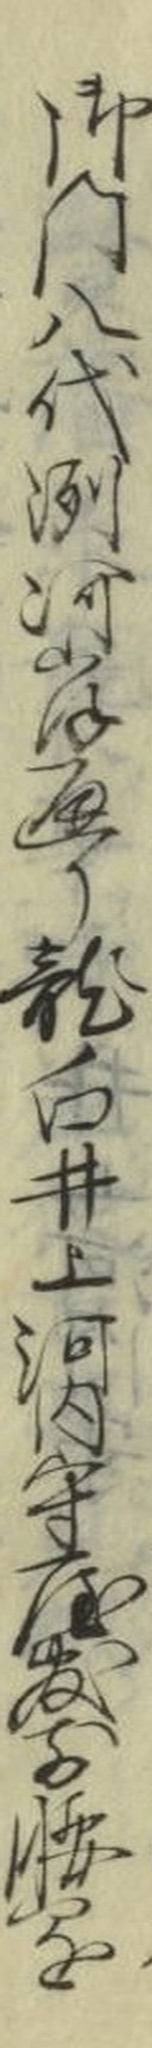御門八代洲河岸通り龍の口井上河内守屋敷前腰懸
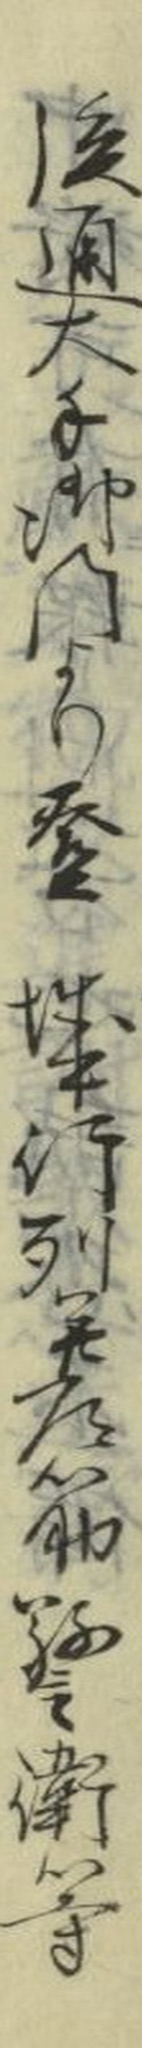後通大手御門より登城行列幷道筋警衛等
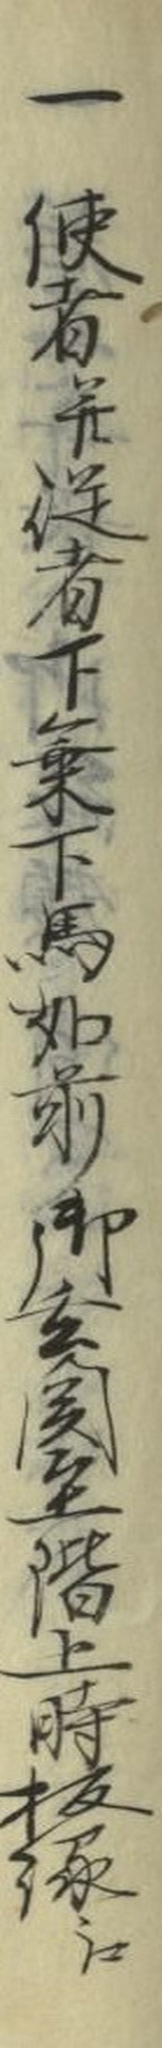一使者幷従者下乗下馬如前御玄関至階上時板縁え
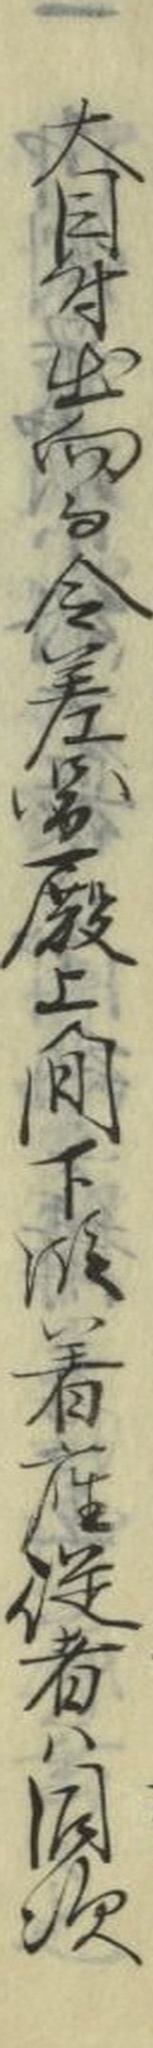大目付出向而令差図殿上間下段着座従者は同次
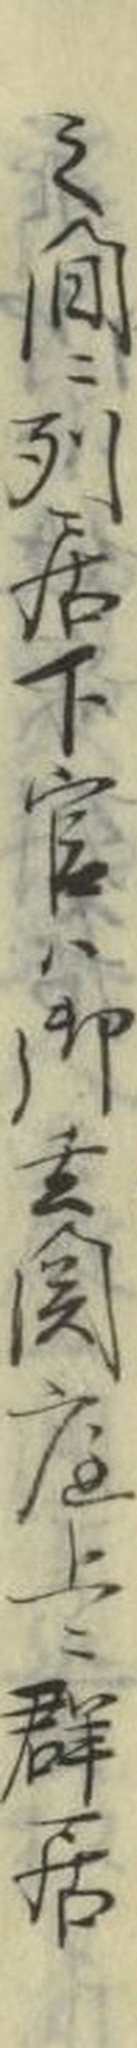之間に列居下官は御玄関庭上に群居
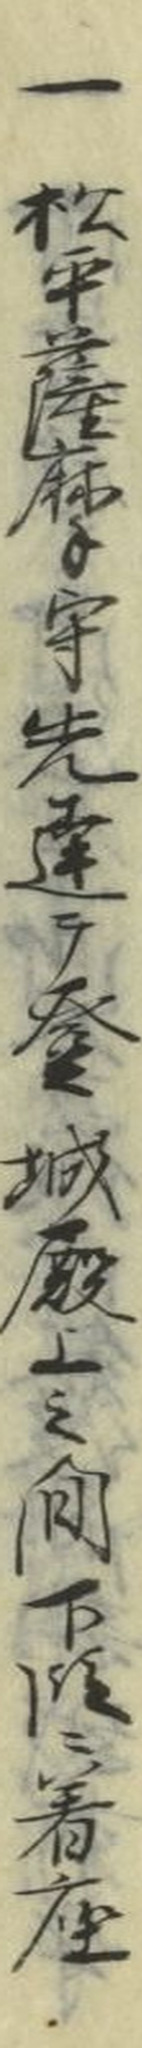一松平薩摩守先達て登城殿上之間下段に着座
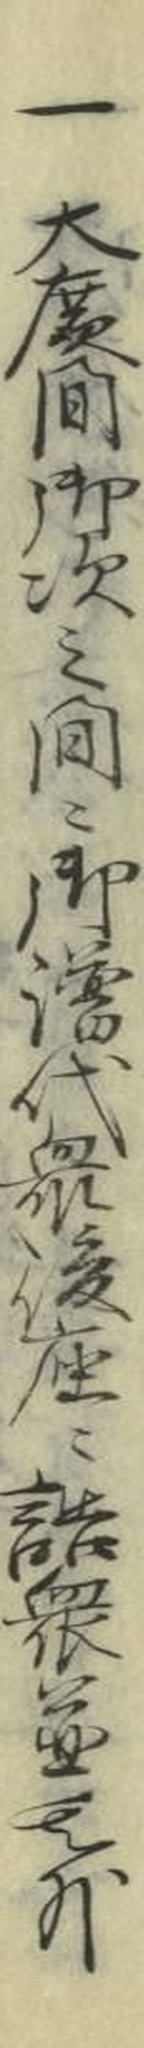一大広間御次之間に御譜代衆後座に諸衆並其外
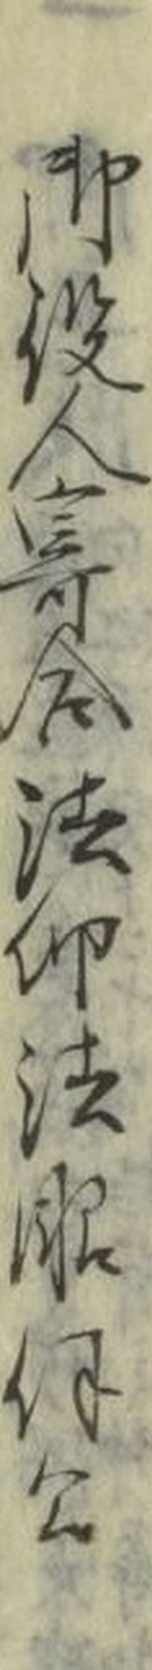御役人寄合法印法眼伺公
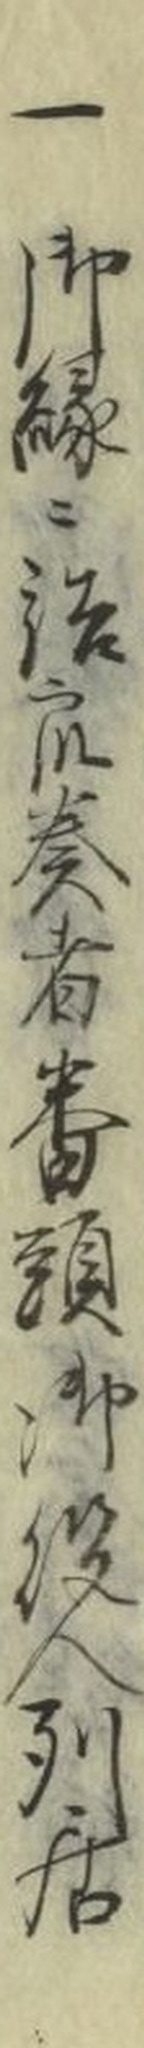一御縁に諸衆奏者番頭御役人列居
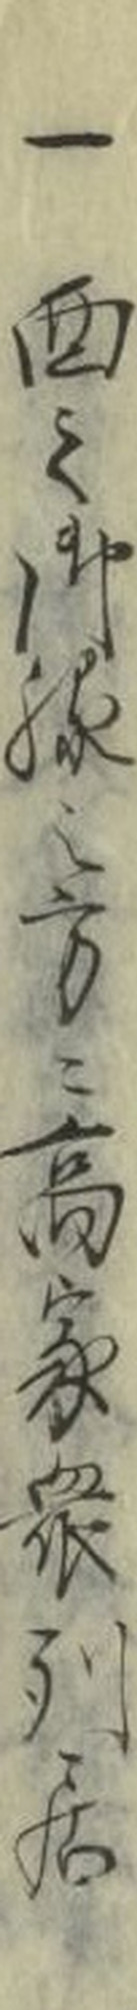一西之御縁之方に高家衆列居
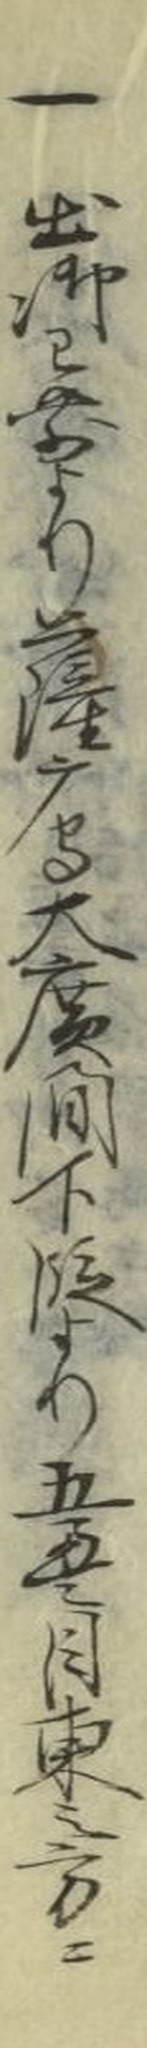一出御已前より薩摩守大広間下段より五畳目東之方に
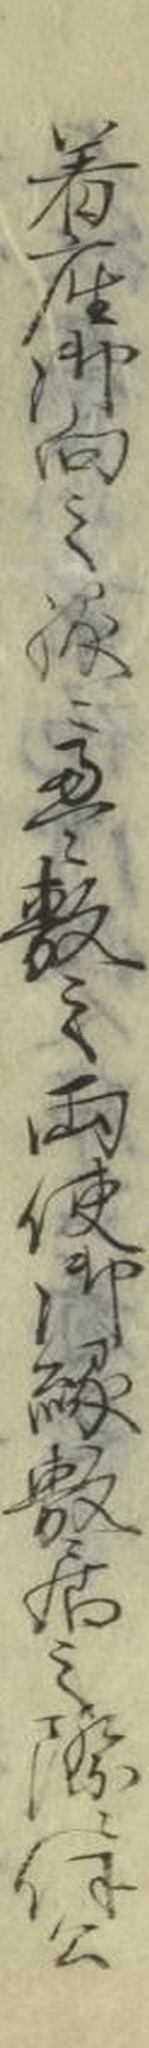着座御向之縁に畳敷之両使御縁敷居之際に伺公
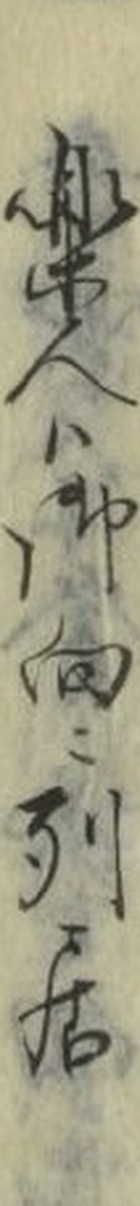楽人は御向に列居

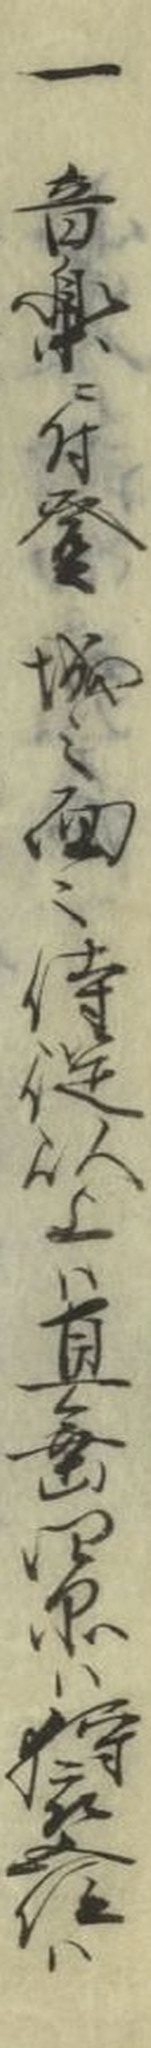一音楽に付登城之面々侍従以上は直垂四品は狩衣五位は
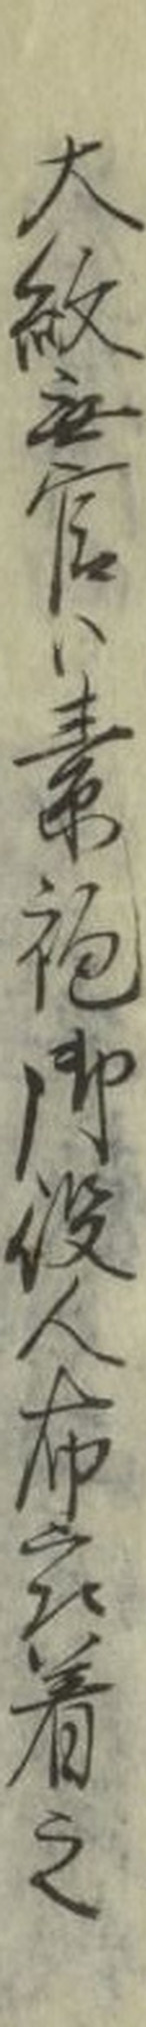大紋無官は素袍御役人布衣着之
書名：宝永七庚寅年琉球国来聘使日記
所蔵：University of the Ryukyus Library
